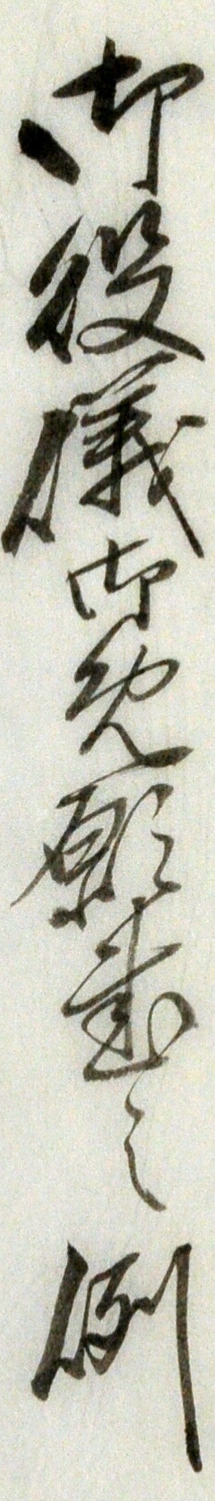御役儀御免願書之例

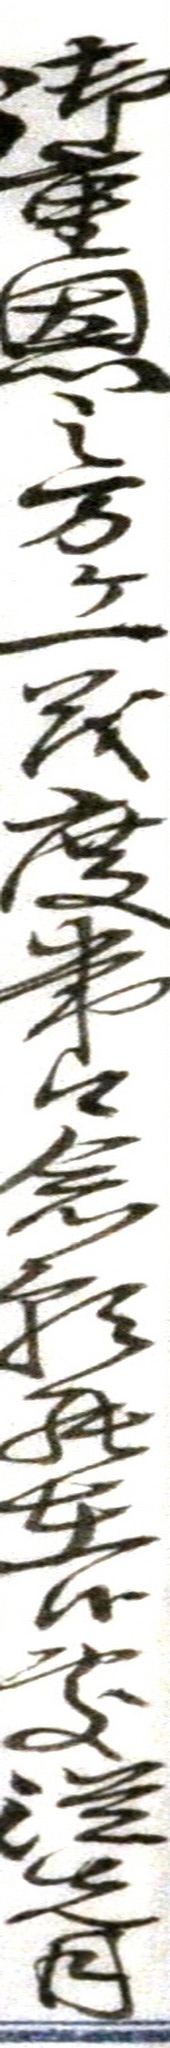御重恩之万ケ一茂度常々念願罷在候処従先月
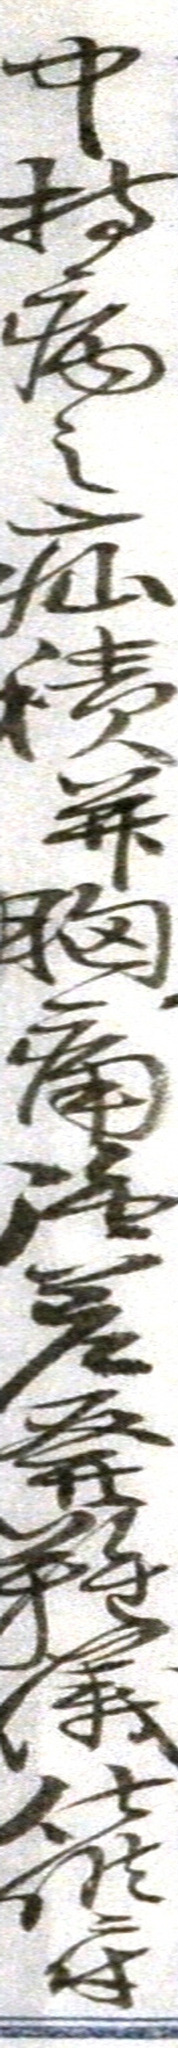中持病之疝積并胸痛強差発難儀仕候ニ付
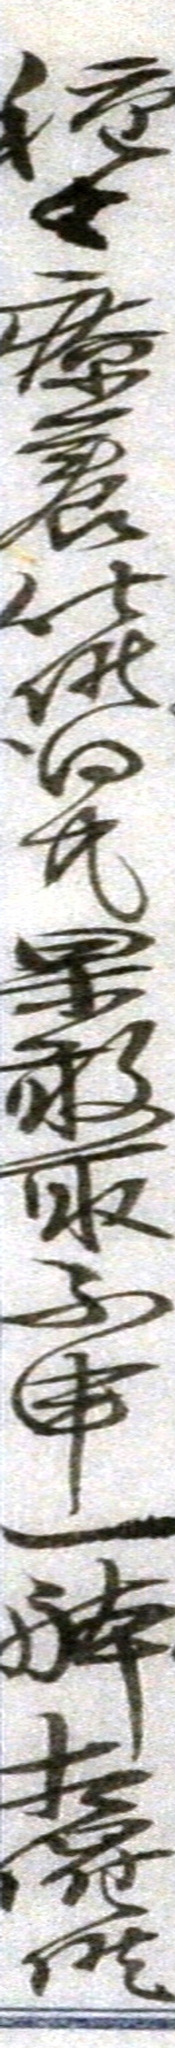種々療養仕候得共果敢取不申一体相催候
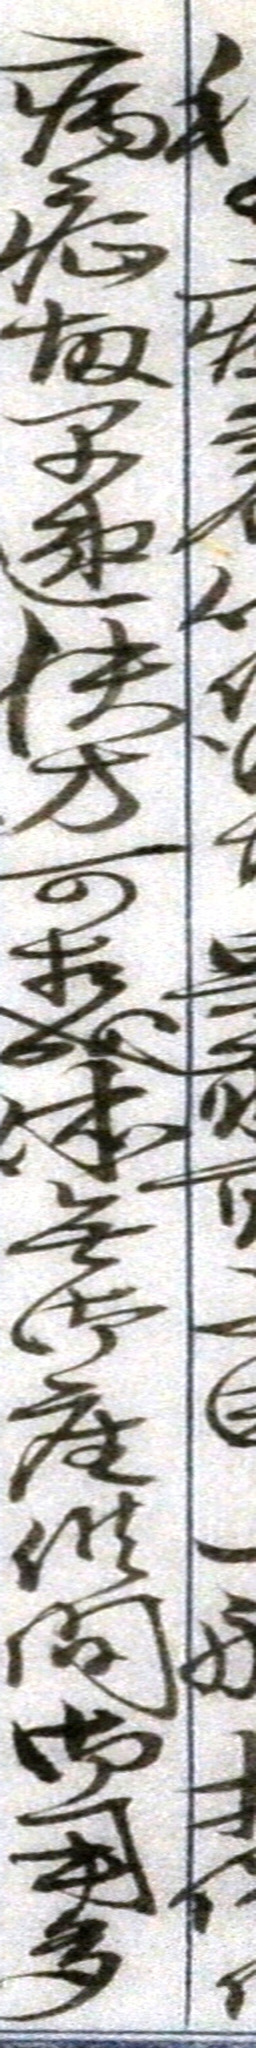病疾故早速快方可相成休無御座候間御用多
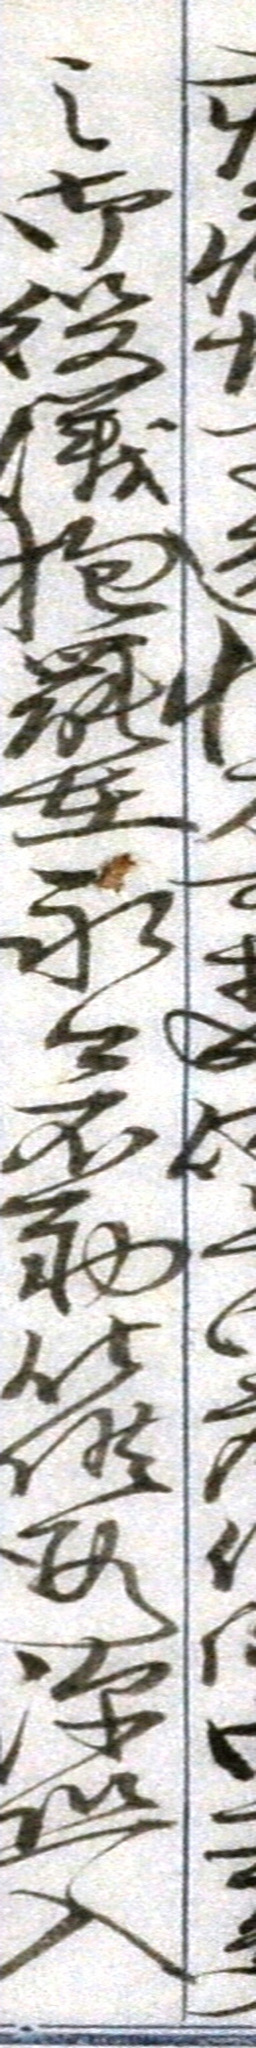之御役儀抱罷在永々不勤仕候様深恐入
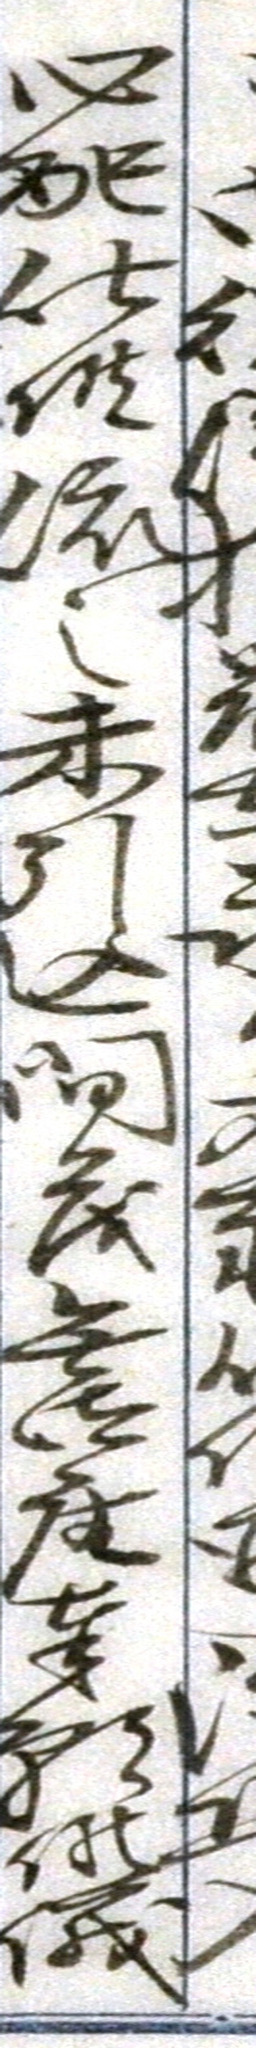心配仕候依之未引込間茂無御座奉願候儀
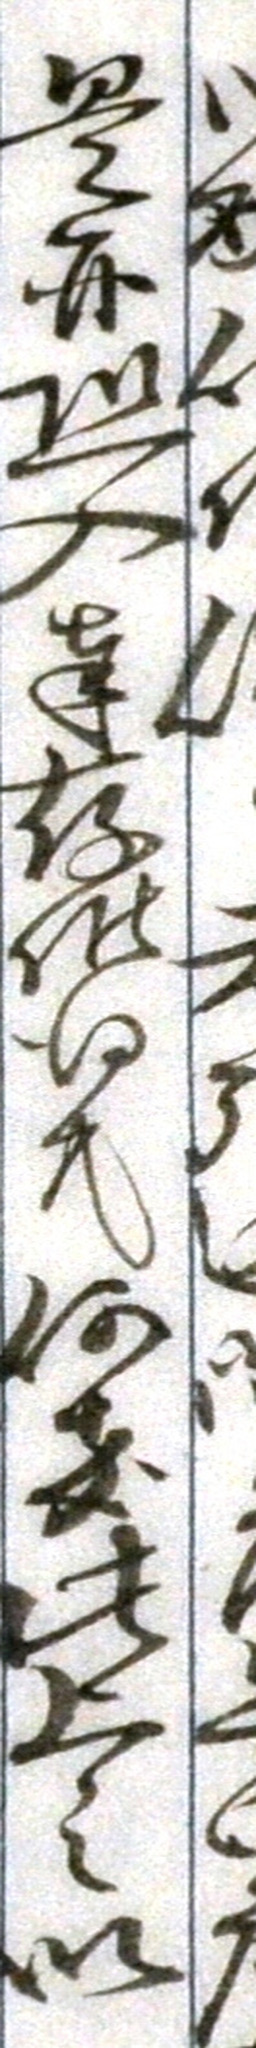是亦恐入奉存候得共何度此上之以
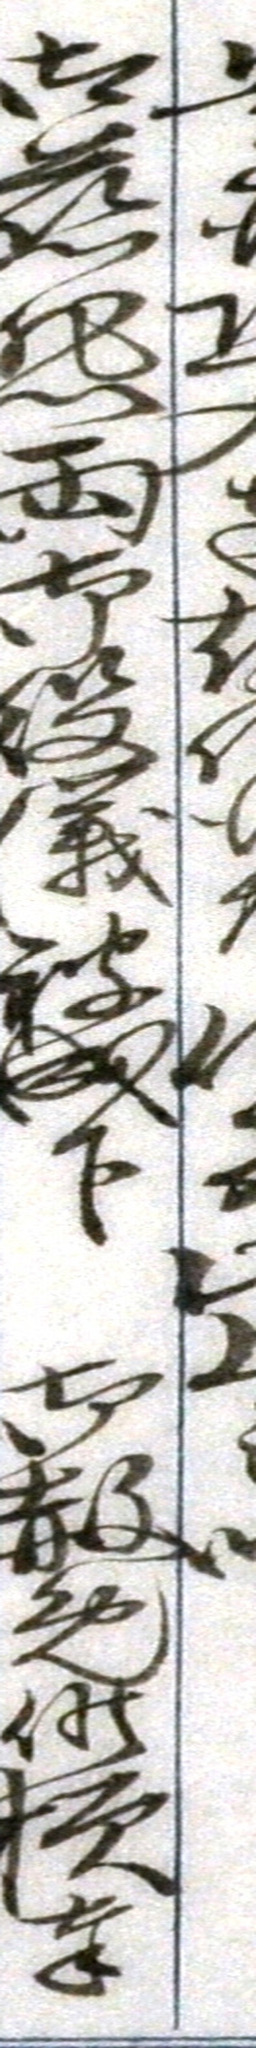御慈悲両御役儀被成下御赦免候様奉
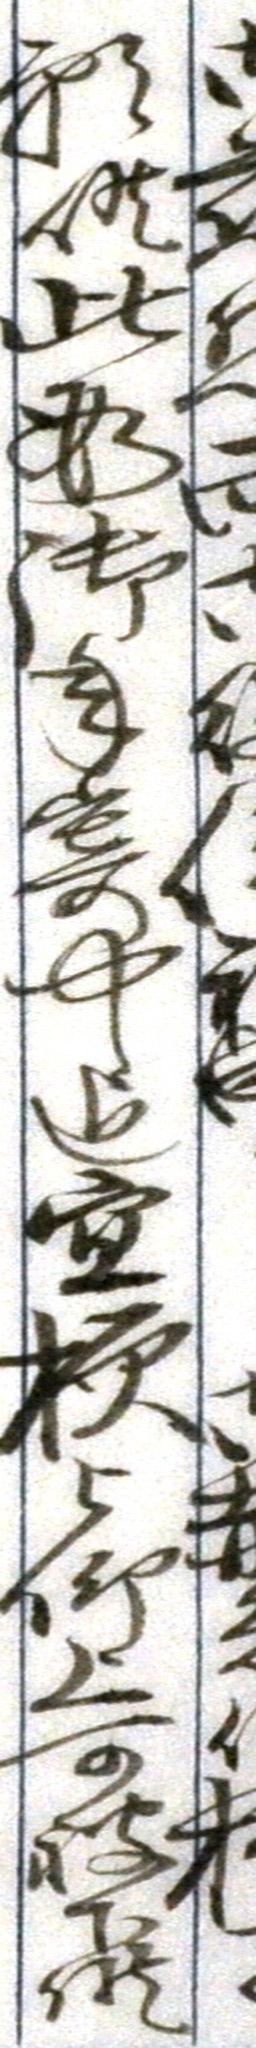願候此段御年寄中迄宜様被仰上可被下候
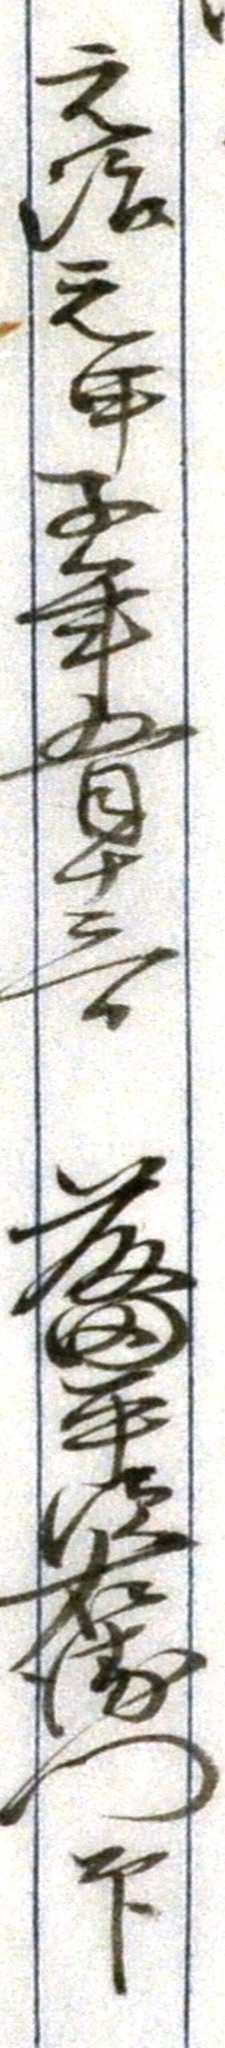元治元甲子年五月十三日藤田平次右衛門印
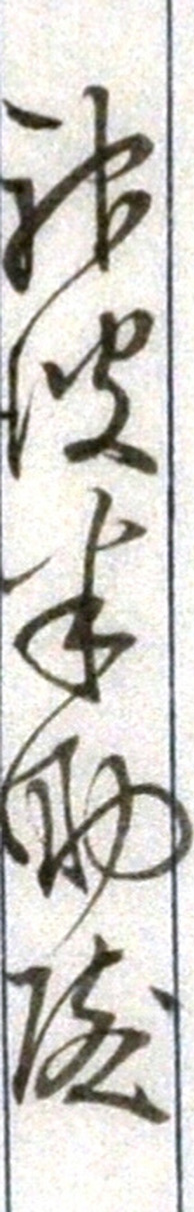神波半助殿
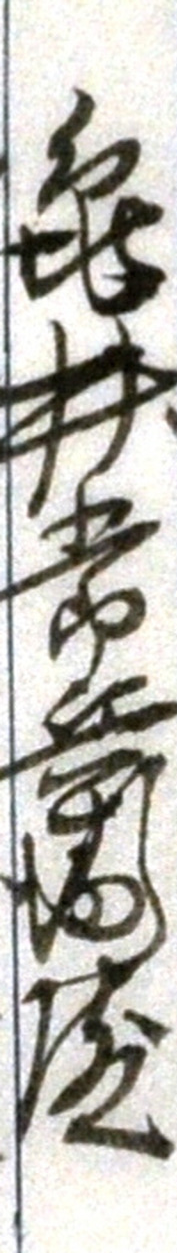亀井常兵衛殿
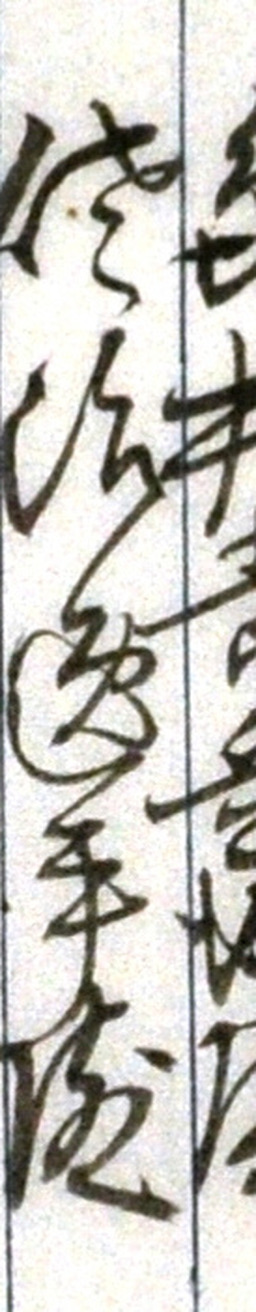佐治逸平殿
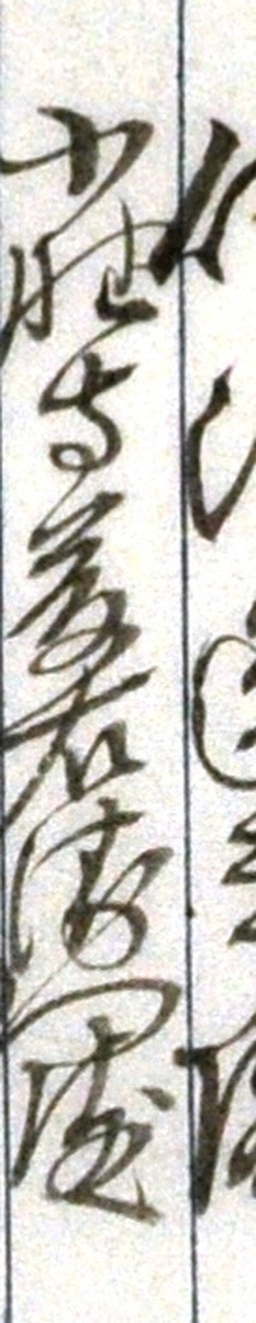小野寺藤右衛門殿
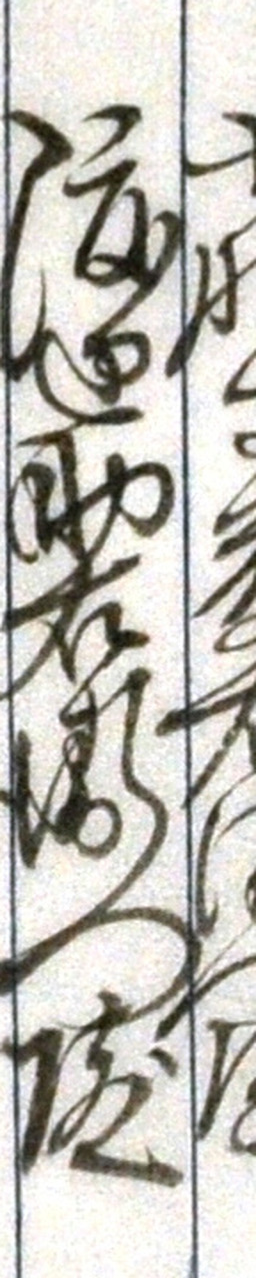渡辺助右衛門殿
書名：御役儀御免願書之例
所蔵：伊那市立高遠町図書館・合同会社AMANE
